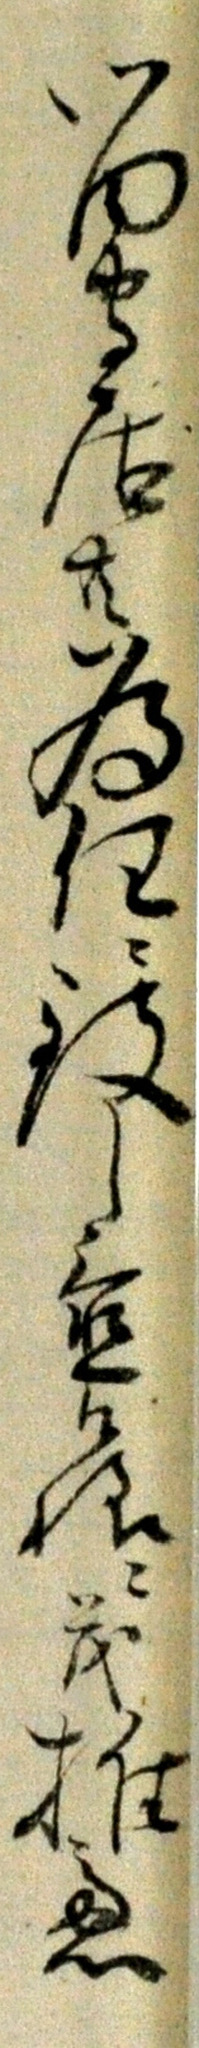留守居共為任に致し置候様にも推慮
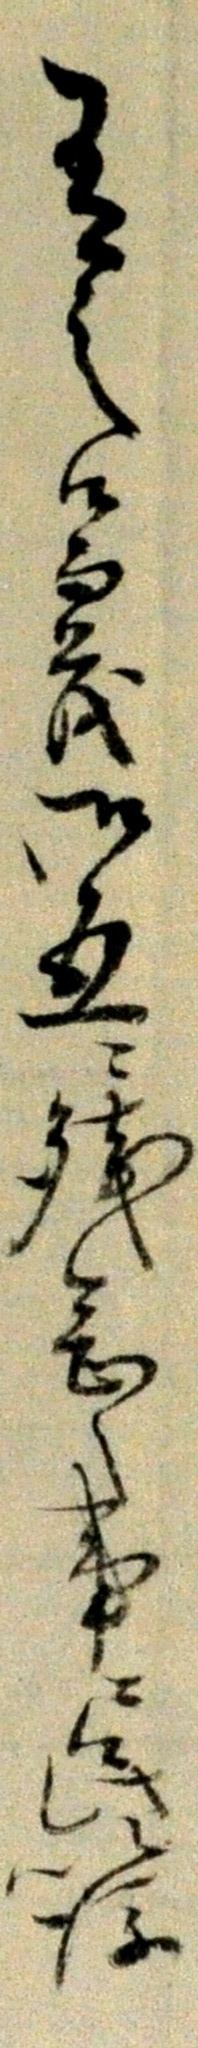有之候ても御互に残念之事に候此以後
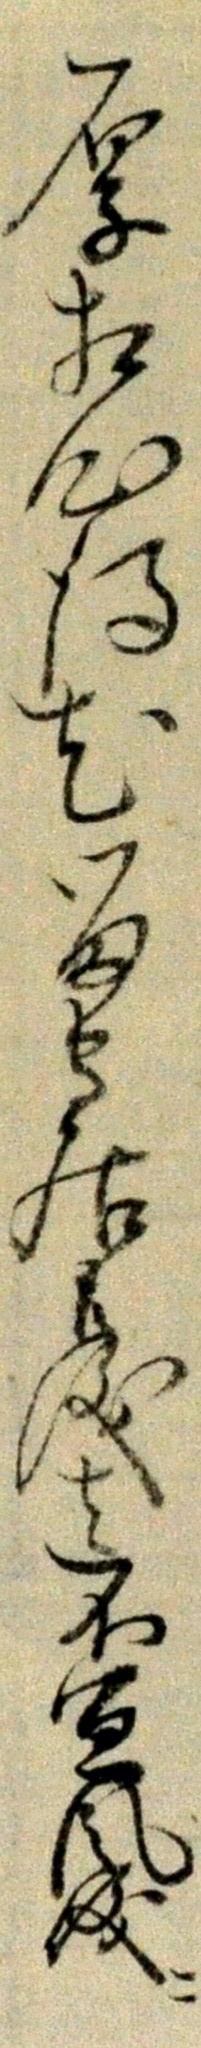厚相心得尤留守居共儀は不宜風儀に
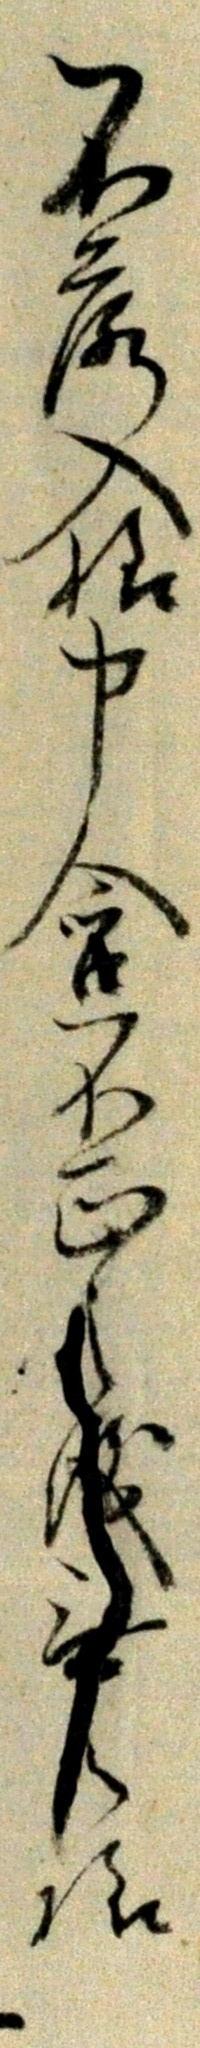不落入様申含不正之儀無之様
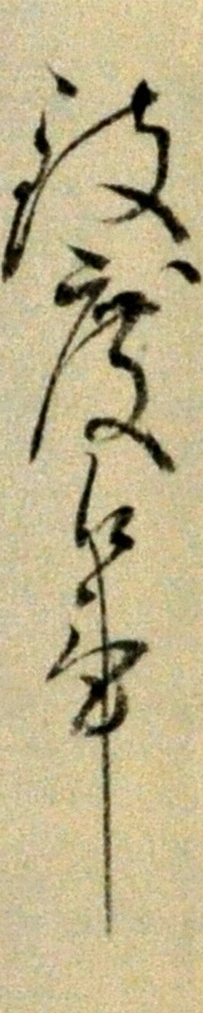致度候事

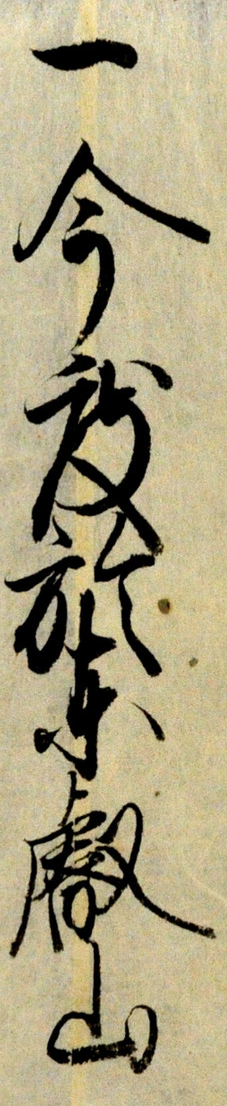一今度於東叡山
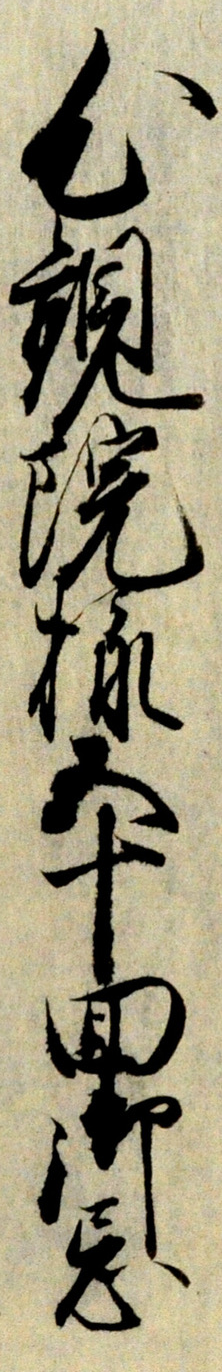心観院様五十回御忌
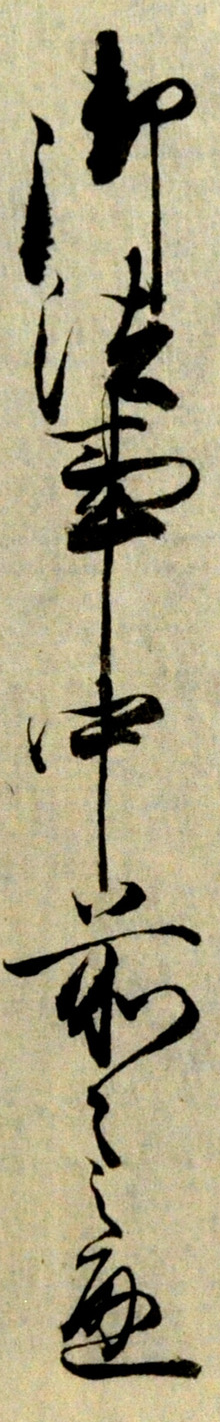御法事中前々之通

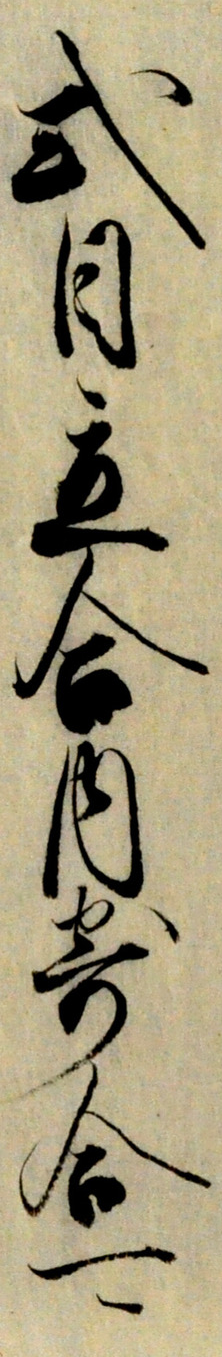式日立合内寄合可
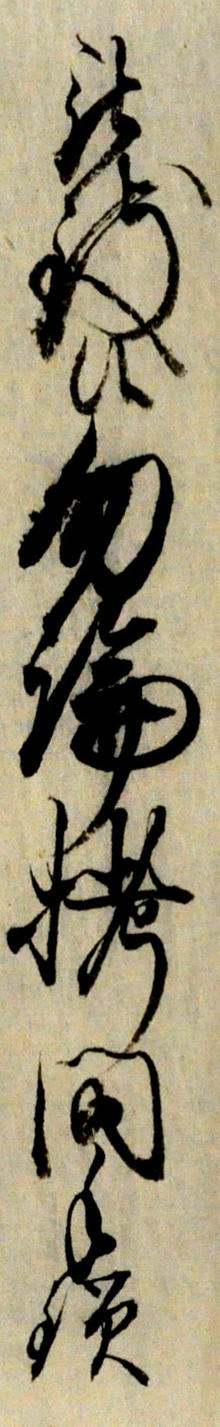被致候勿論拷問手鎖
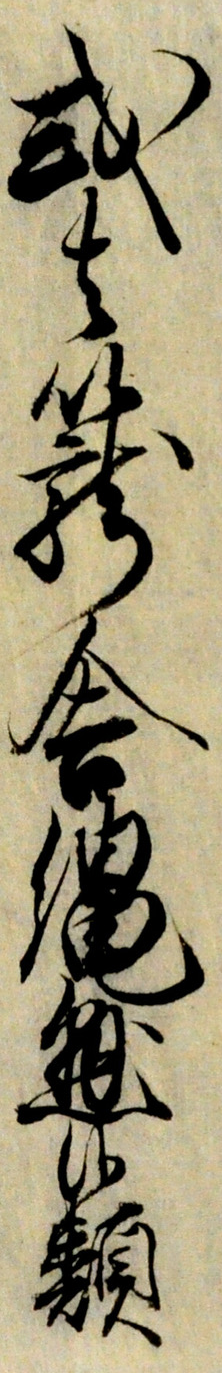或は籠舎縄懸候類
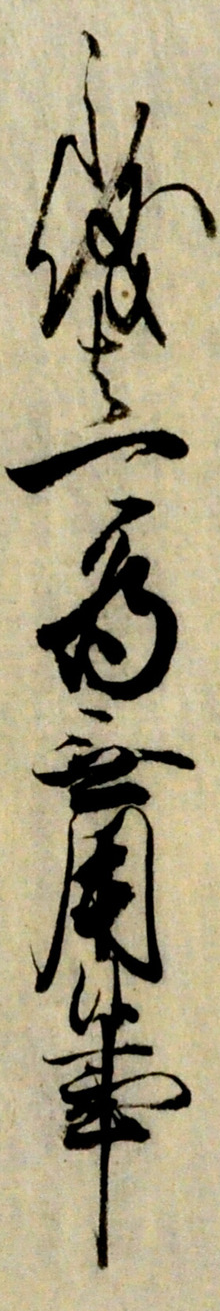之儀は可為無用候事
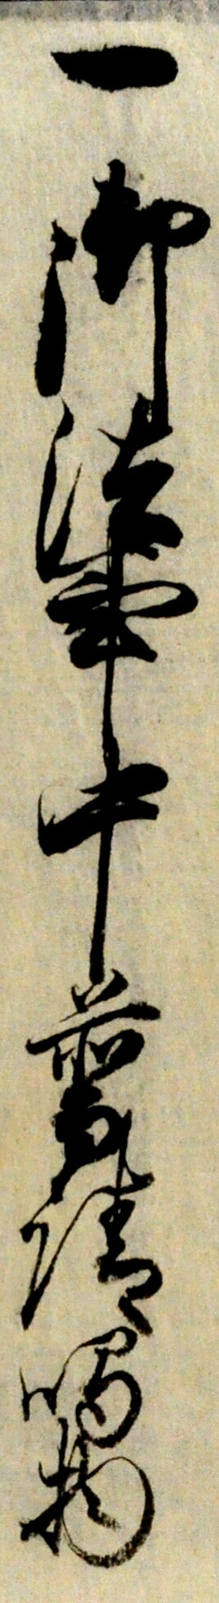一御法事中普請鳴物
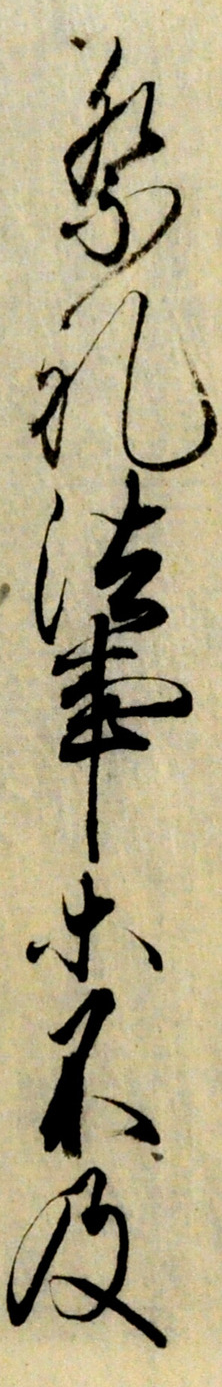祭礼法事等不及
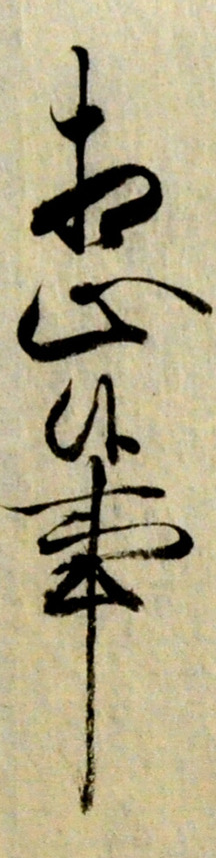相止候事

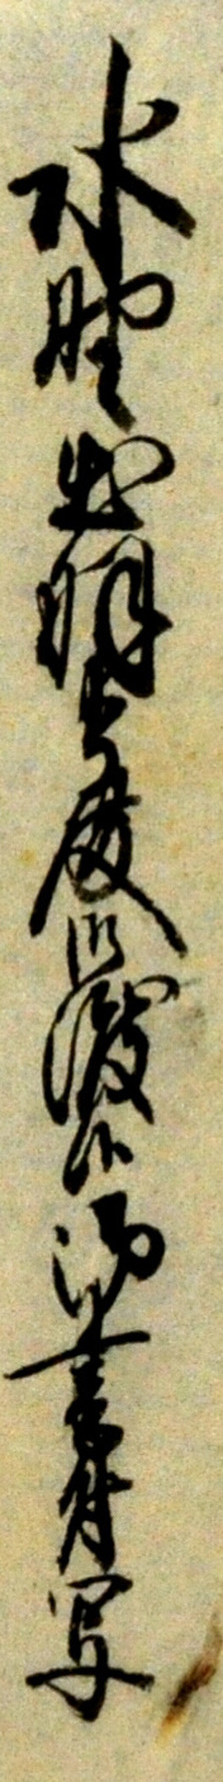水野出羽守殿御渡候御書付写
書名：申合帳〔一括〕
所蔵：伊那市立高遠町図書館・合同会社AMANE
